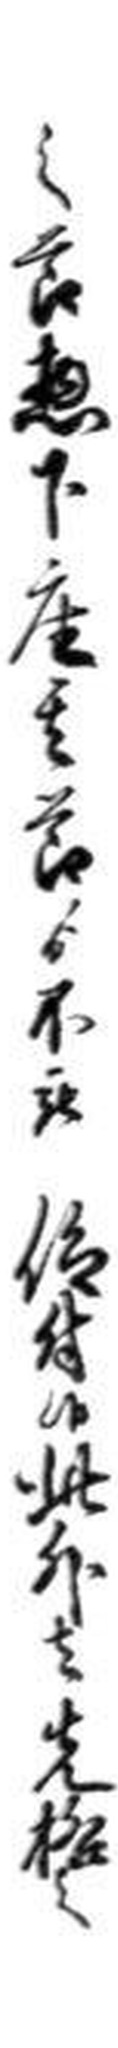之節惣下座其節ゟ不被仰付候此外者先格之
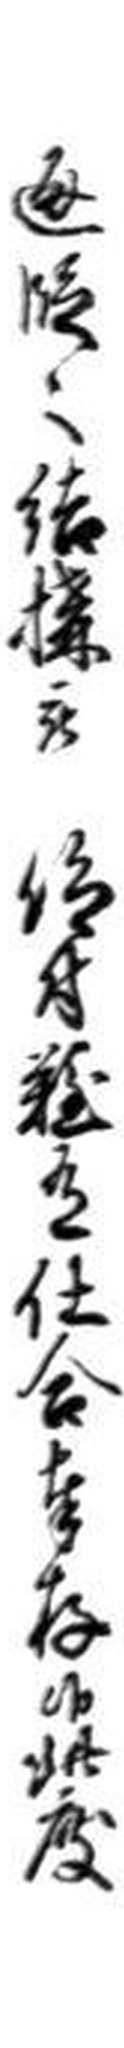通段々結構被仰付難有仕合奉存候此度
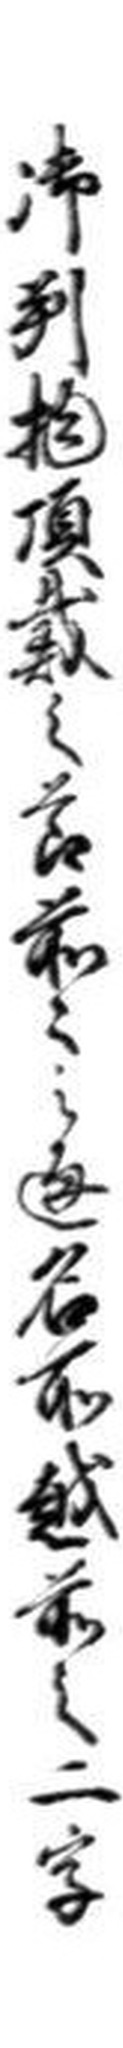御判物頂戴之節前々通名所越前之二字
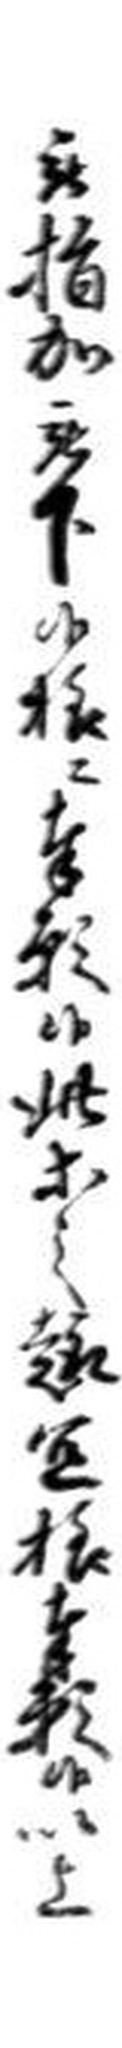被指加被下候様ニ奉願候等之趣宜様奉願候以上
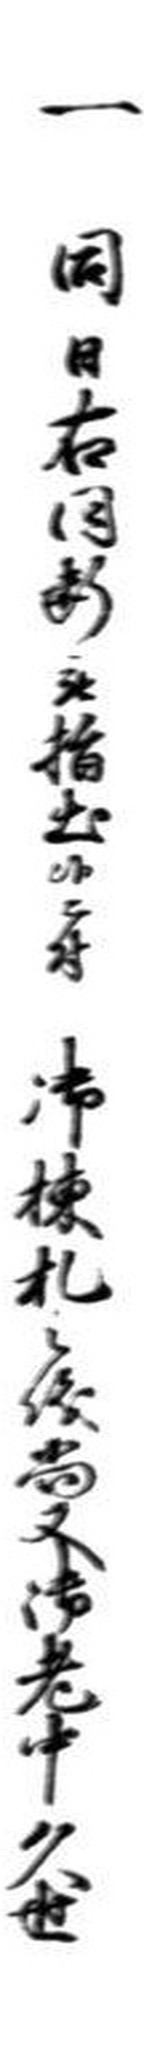一同日右同断被指出候ニ付御棟札之儀尚又御老中久世
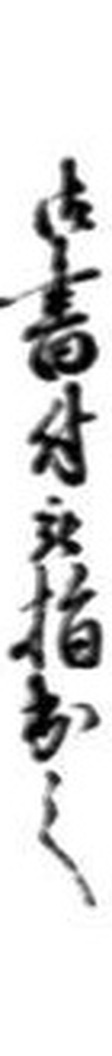御書付被指出之
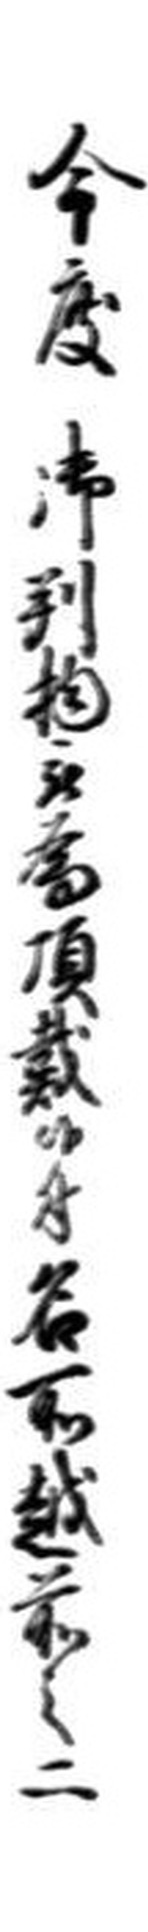今度御判物被為頂戴候付名所越前之二
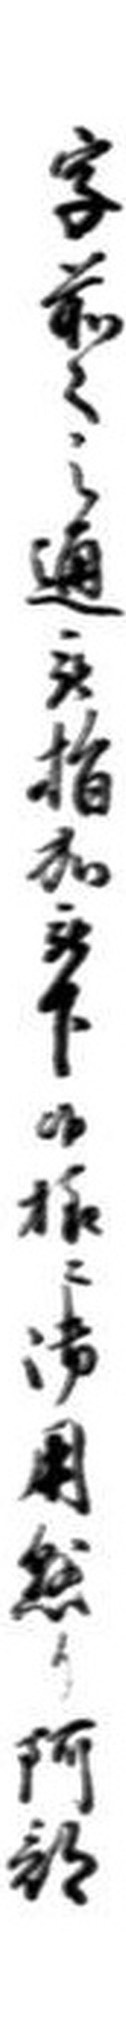字前々之通被指加被下候様ニ御用懸り阿部
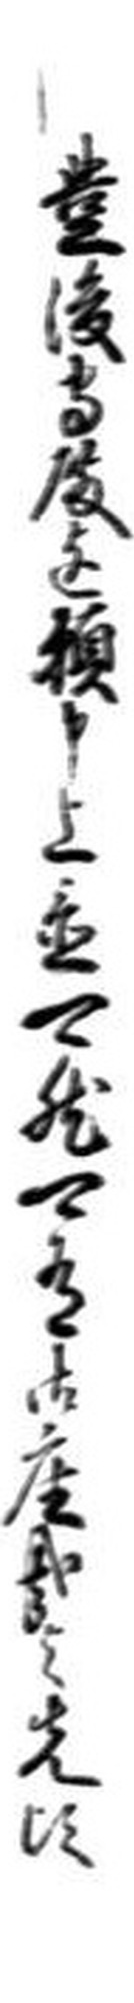豊後守殿迄願申上置可然可有御座哉と先頃
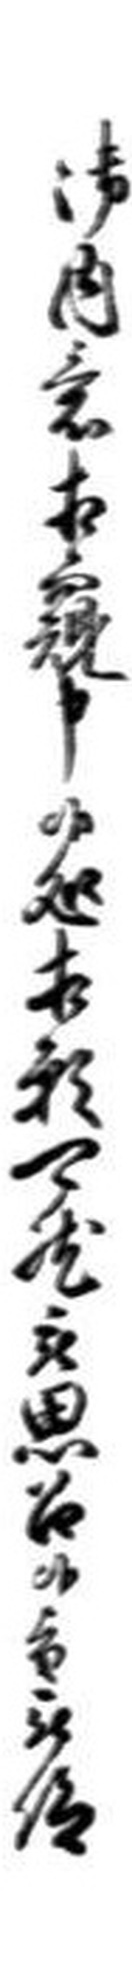御内意相窺申候処相願可然被思召候旨被仰
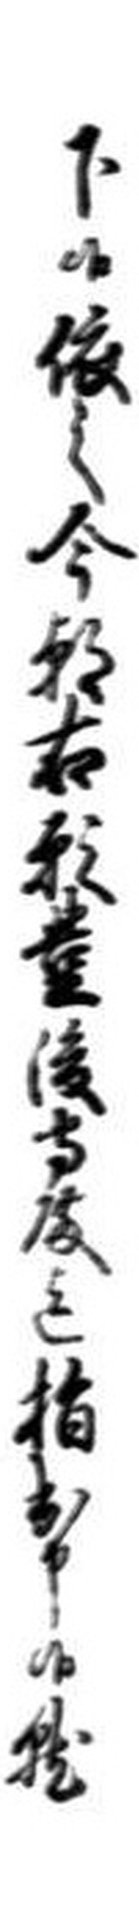下候依之今朝右願豊後守殿迄指出申候就
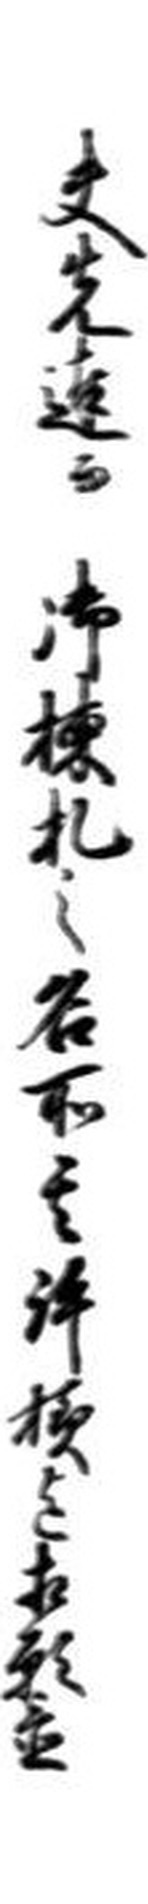夫先達而御棟札之名所其許様迄相願置

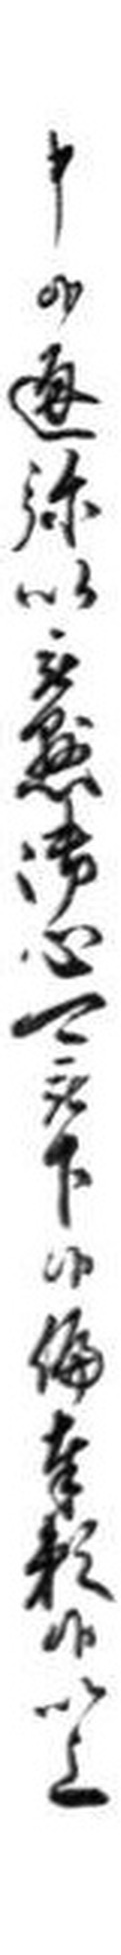申候通弥以被懸御心可被下候偏奉願候以上
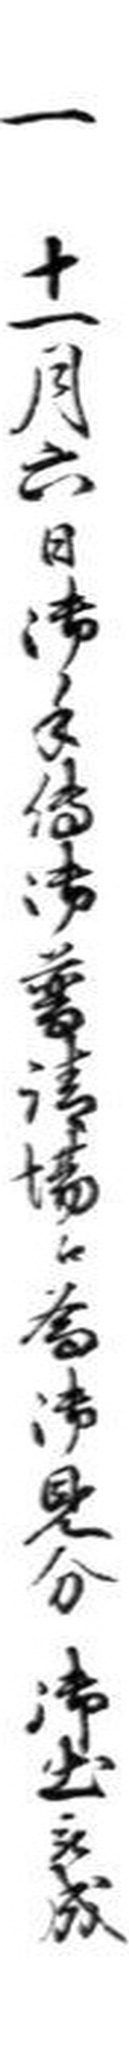一十一月六日御手伝御普請場江為御見分御出被成
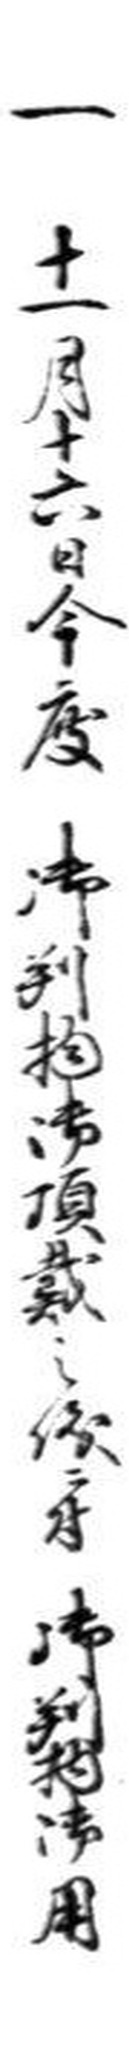一十一月十六日今度御判物御頂戴之儀ニ付御判物御用
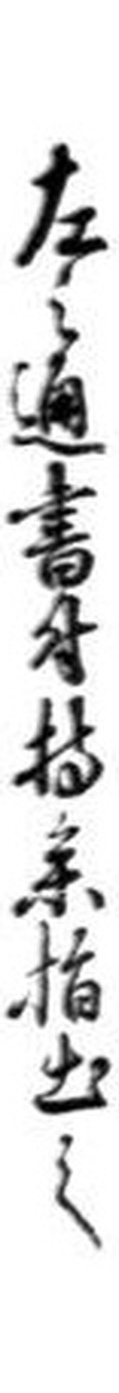左之通書付持参指出之
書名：家譜 三十一 吉邦公 享保元年
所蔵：福井県文書館 Fukui Prefectural Archives
